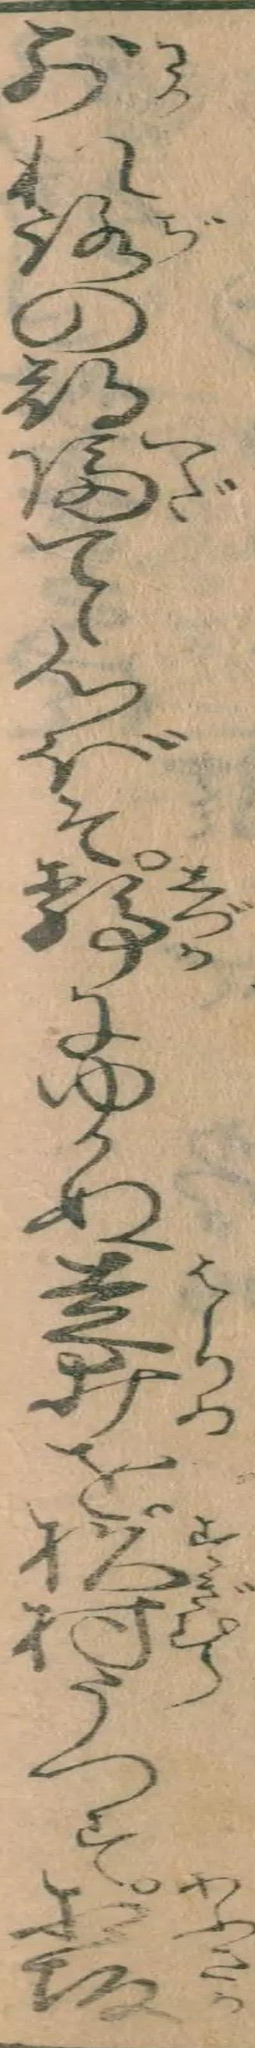別れ路の都隔てゝ心ぼそ。静にゆかぬ走井を杉村うつす。相坂
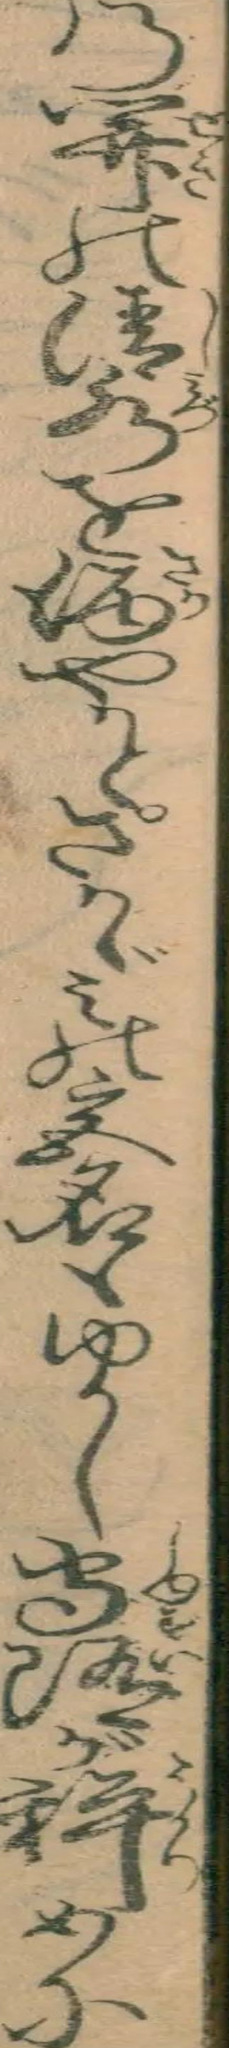の関の清水を酒やかと。さかゞみの宮名もゆかし守随が秤めに
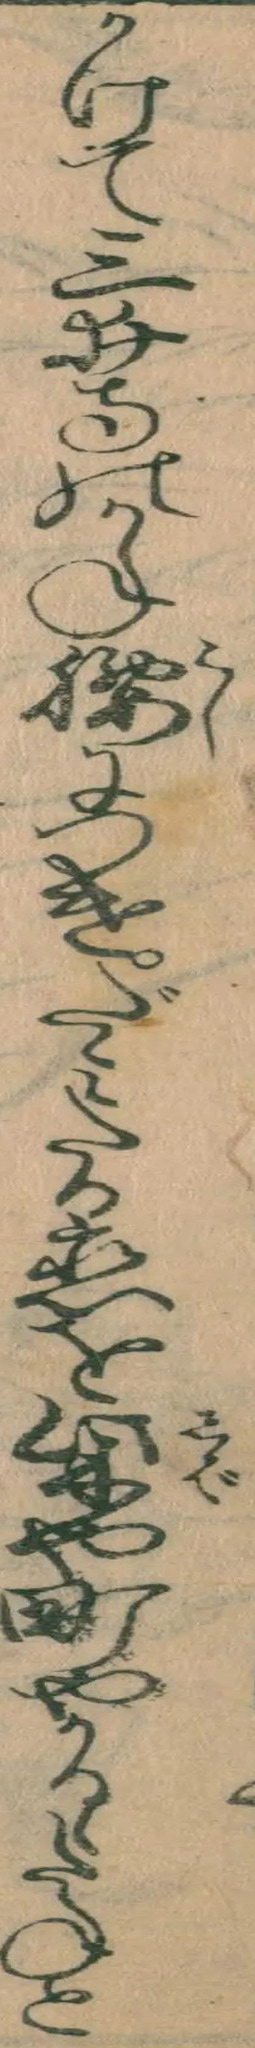かけて三井寺のかね腰につけ。だみたる恋を柴や町やかるゝたねと
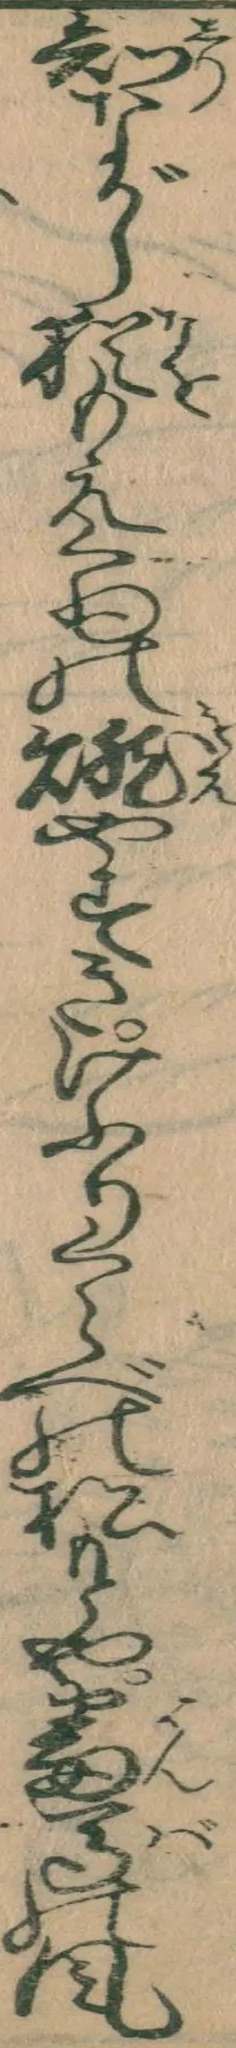知ながら猶もえくゆの燃やすき。けふりくらべの松もとや。番馬の風
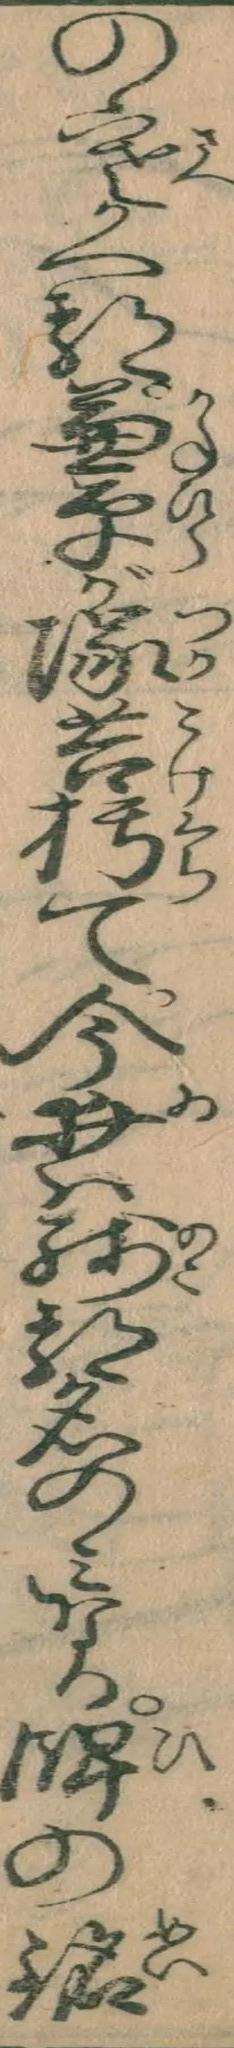の寒かへる。兼平が塚苔朽て。今井は残る名のみなる。碑の銘
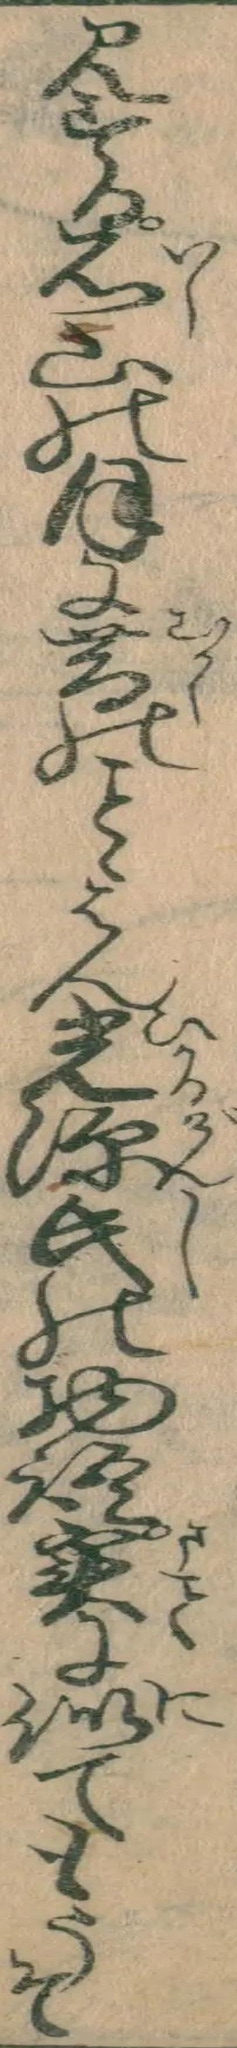見する。石山の月に昔のこととはん光源氏の物語。実に似てもうそ
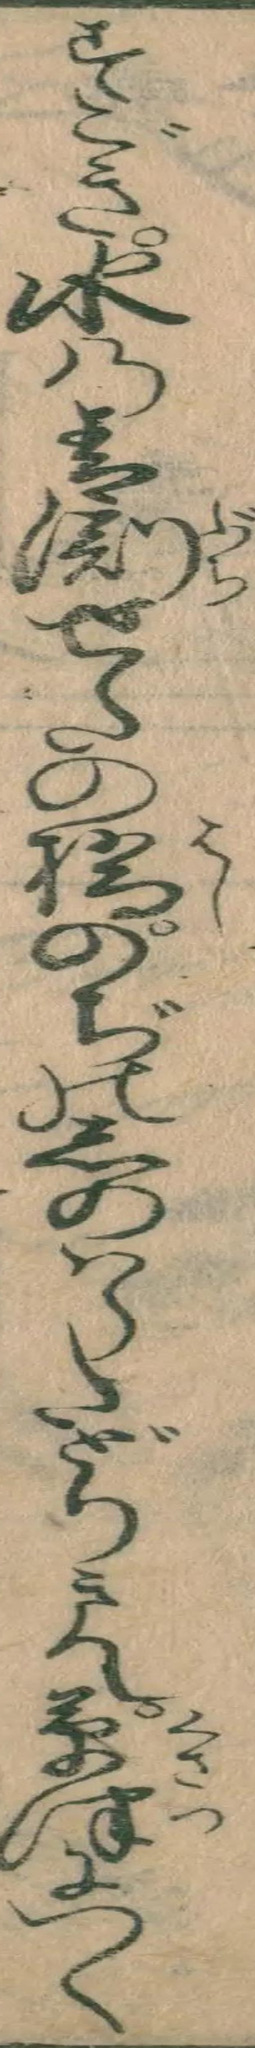すごき。水の青淵せたの橋。のぢのしのはらたどりきん。草津につく
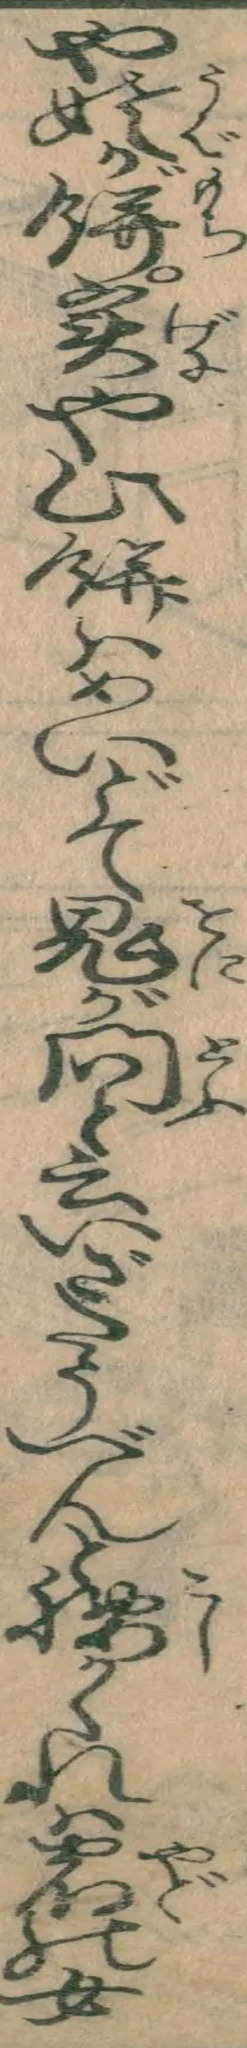や姥が餅。実や此餅はめいどて鬼が問と云いざたうべんと腰かくれは宿の女
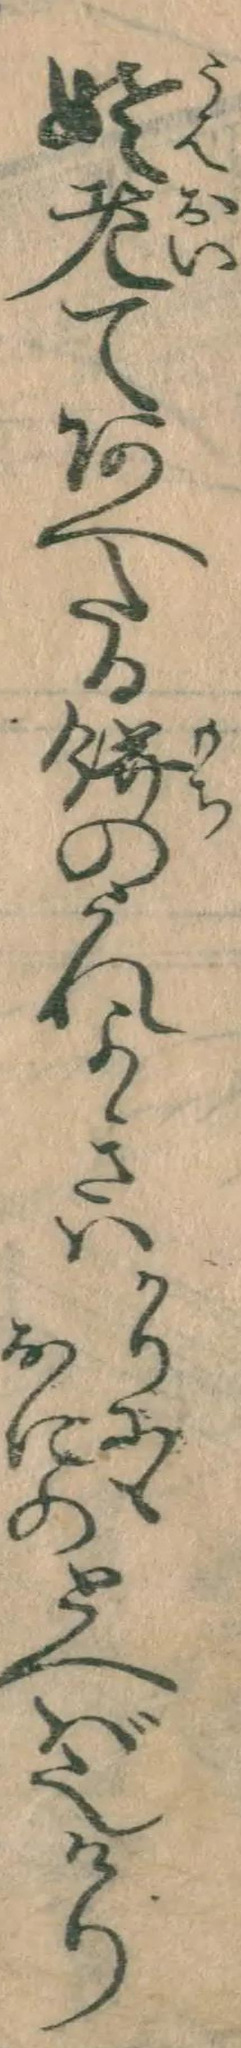姥老てあへたる餅のうれよきはかりにもおにのとへば也けり
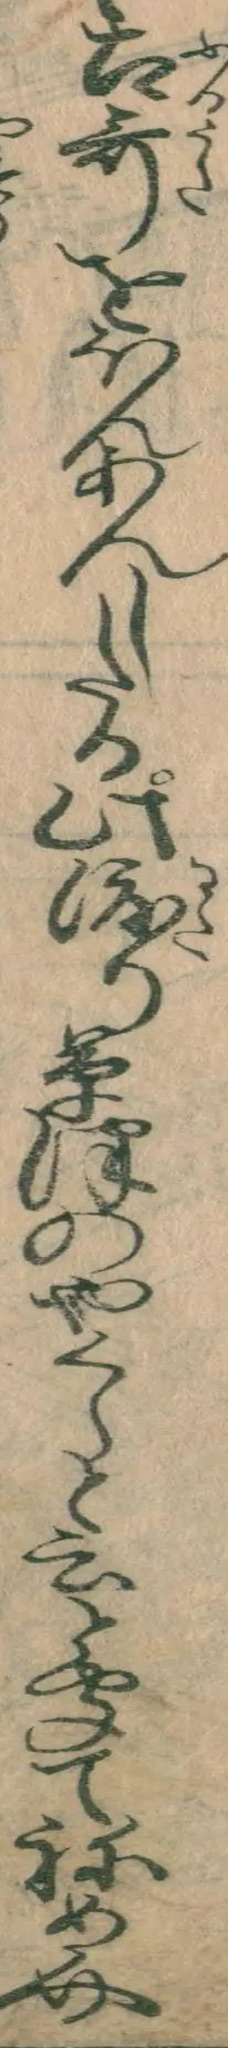と古歌をほんあんしたる。此渡り草津のやくらと云と聞てねめ介
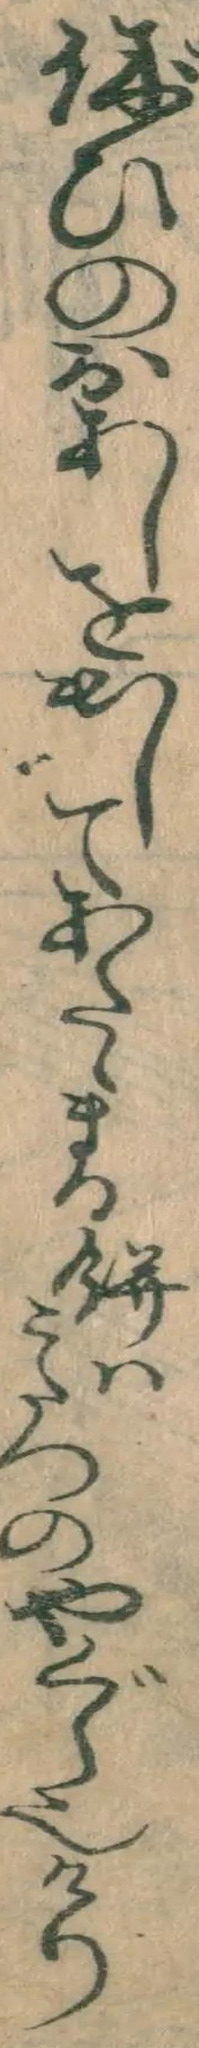休ひのおあしを出してあたゝまる餅はこたつのやぐら也けり
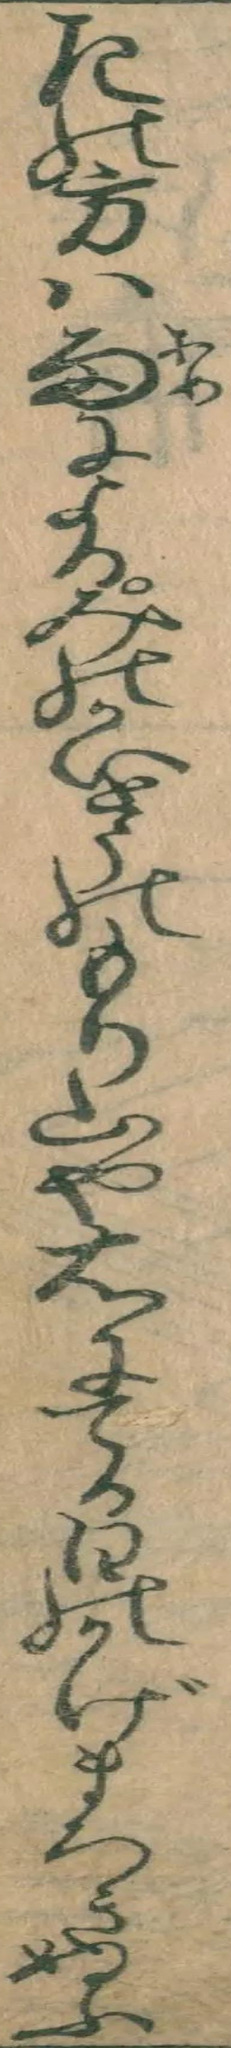左の方は雨による。みのかいとうのもり山や右にてる日のかげまろきぬふ

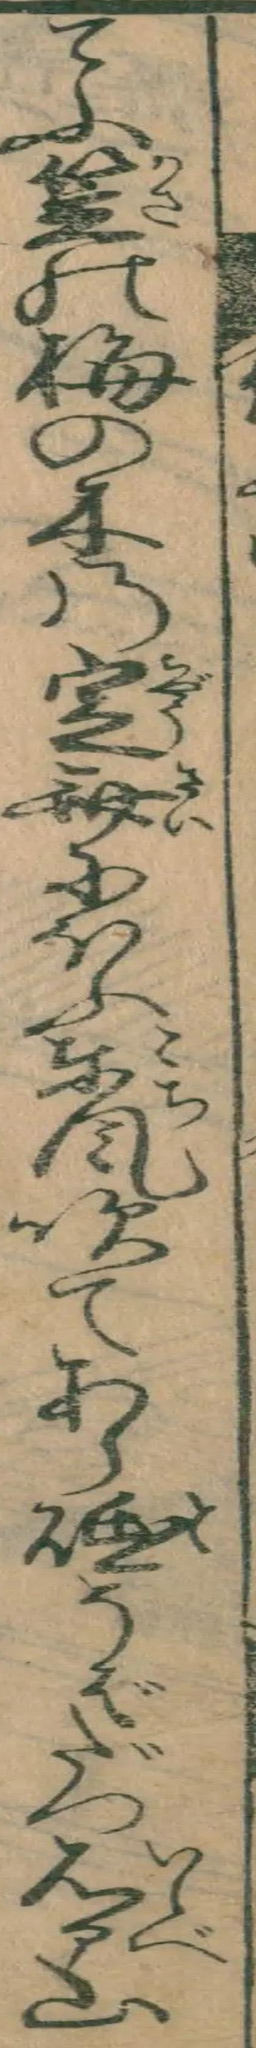てふ笠の梅の木の定斎にほふ東風吹てあら砥そばだつ石部山
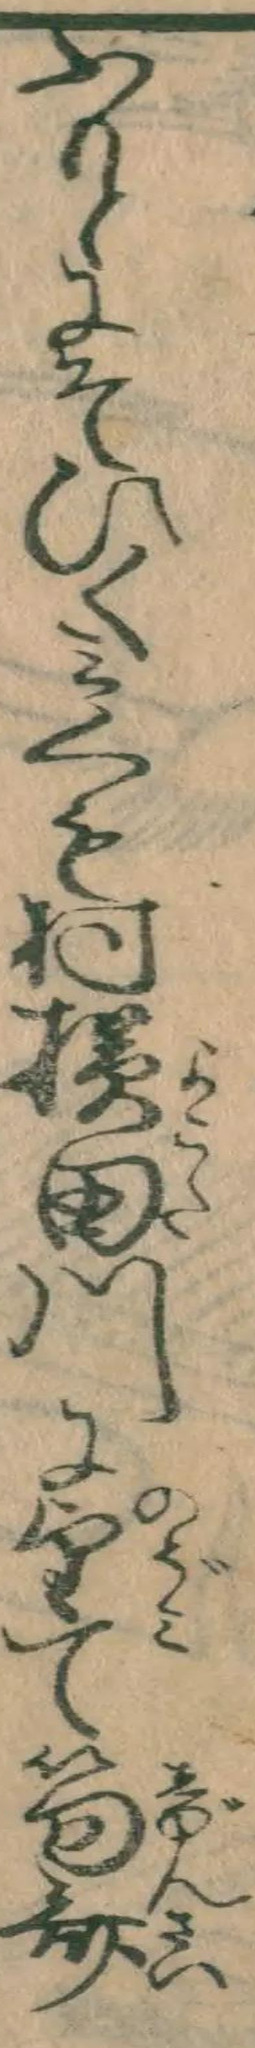ふもとにそひ〳〵みくも村横田川に望て筍斎
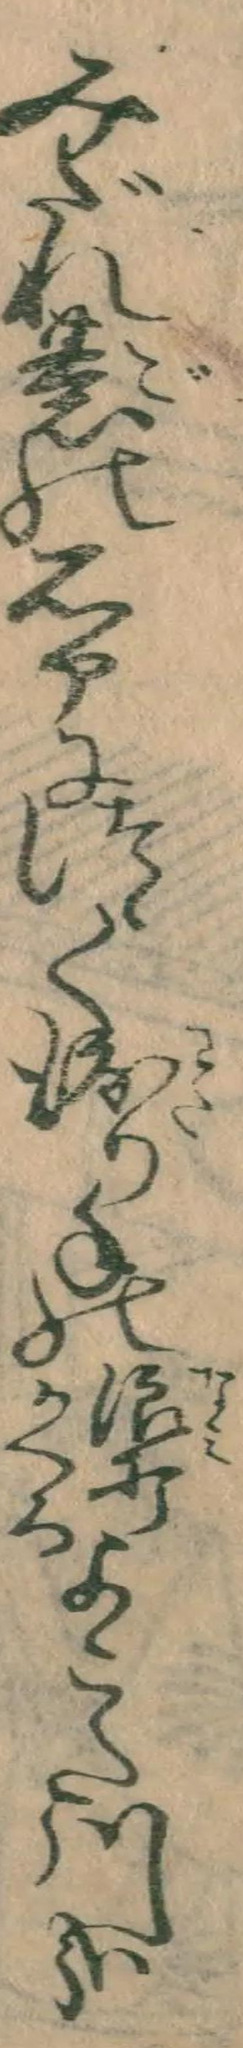みだれ碁の石部につゝく渡り手の浪打かへるよこた川哉
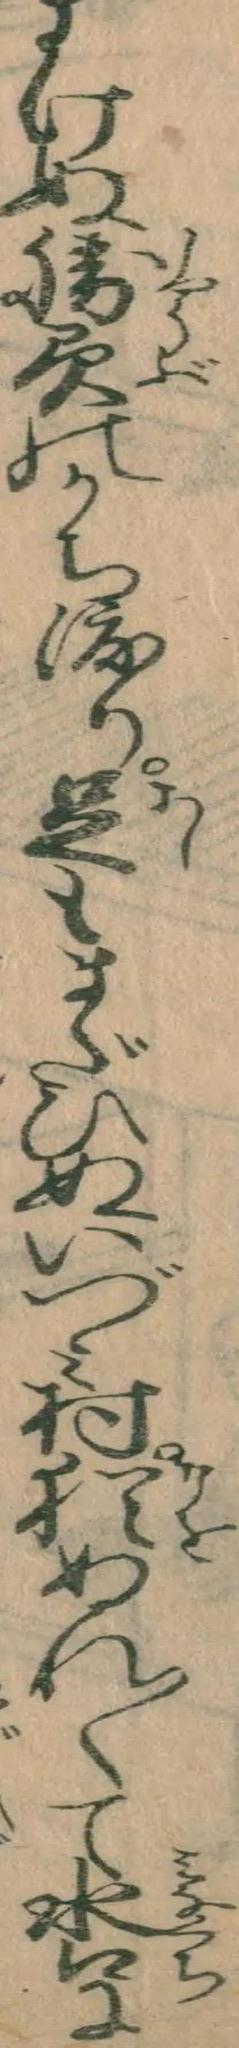まけぬ勝負のかち渡り。足もまだひぬいづみ村。猶ぬれ〳〵て水口に
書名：新竹斎 5巻
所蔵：国立国会図書館 National Diet Library, JAPAN
